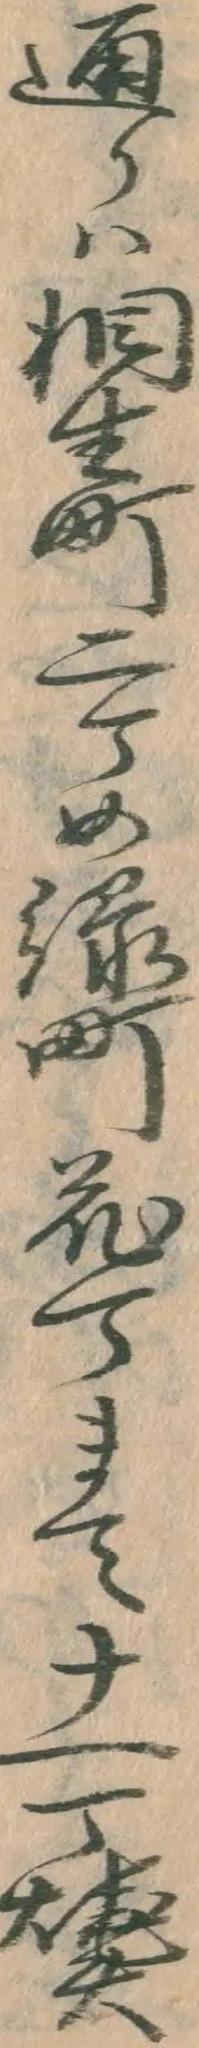通りハ相生町二丁め緑町花丁まて十一丁燒失
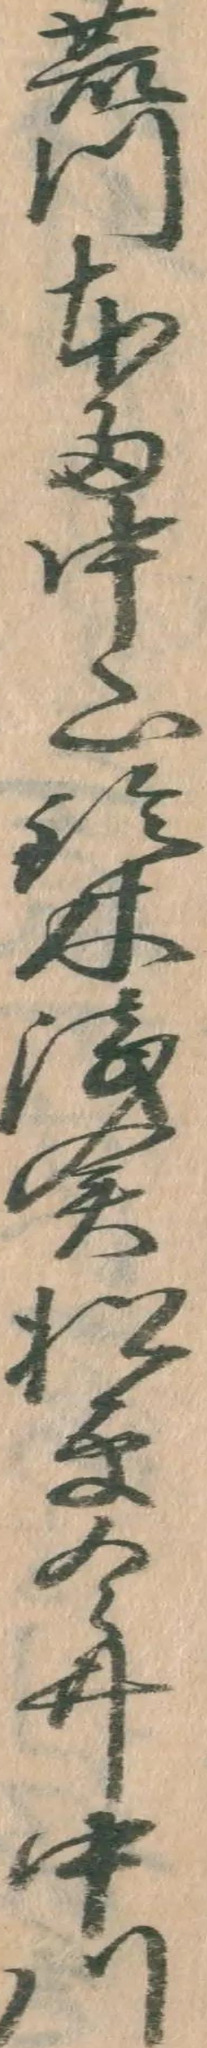荒川本多中山鈴木浅倉松平今井中川
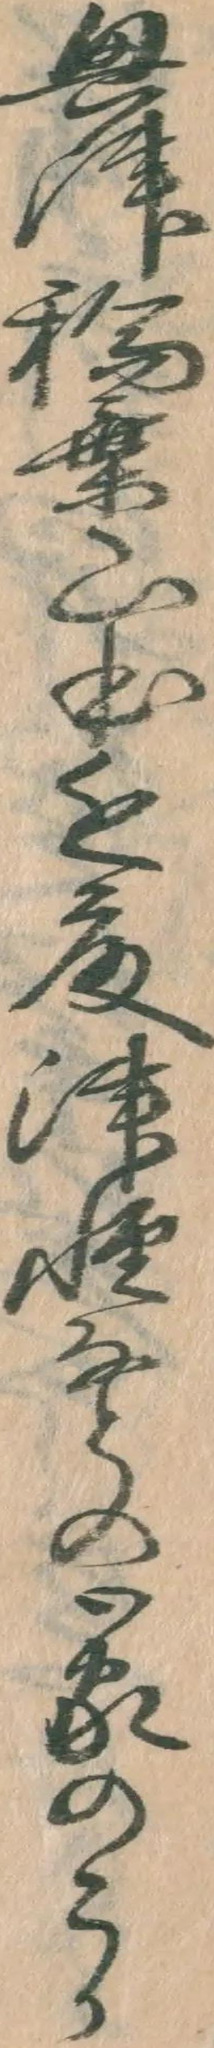奥津稲葉山本近藤津輕なとの御家のこり
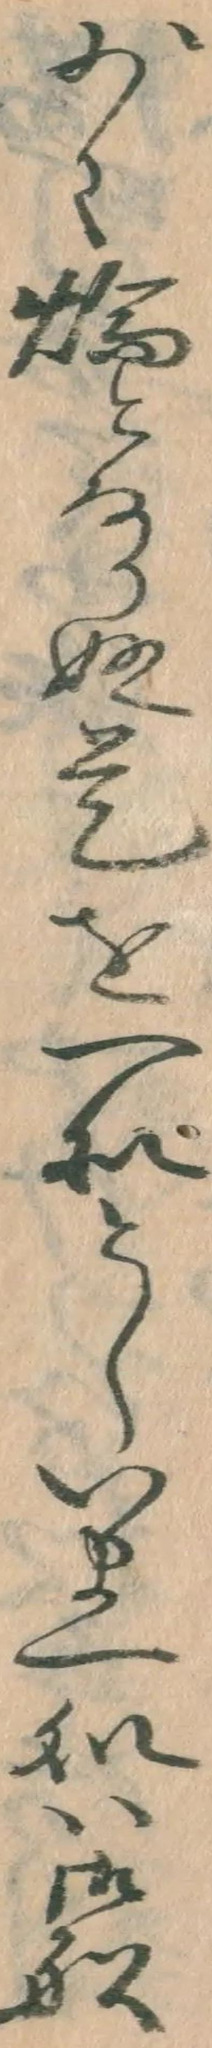少に焰となりぬ是を一処としいま一処ハ御船
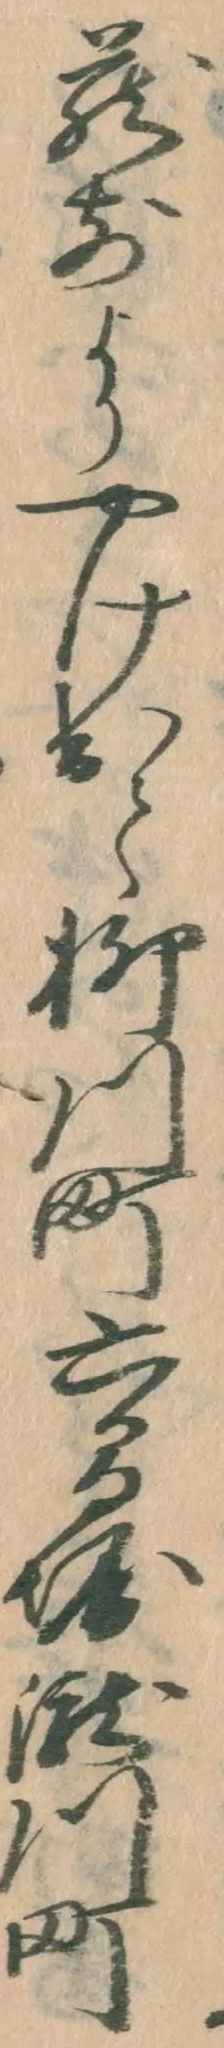蔵前よりやけ出て柳川町六間堀瀧川町
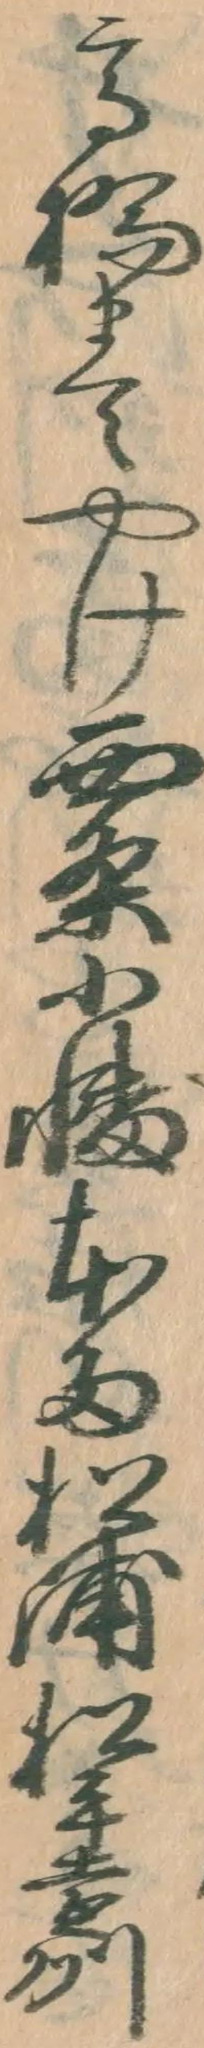高橋まてやけ西条小幡本多松浦松平遠州

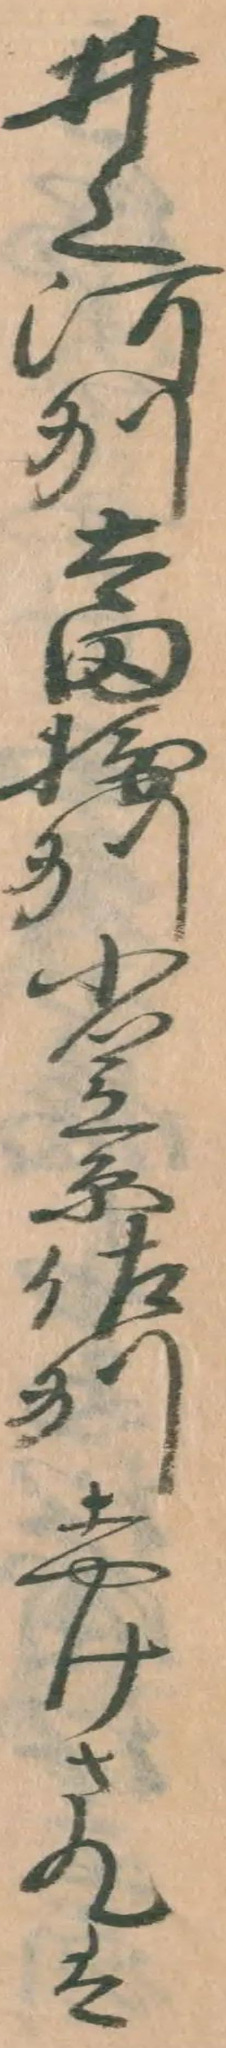井上河州吉田摂州小笠原佐州等やけされは
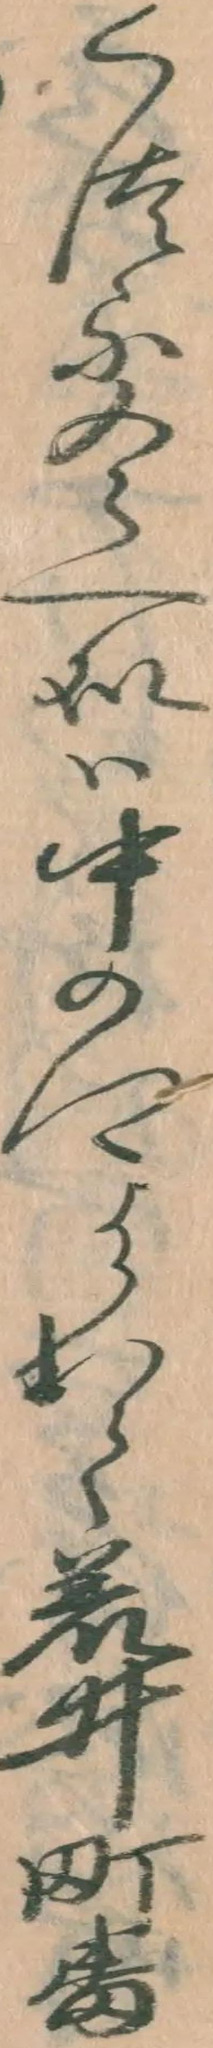くつる今一処ハ中の郷より出て荒井町番
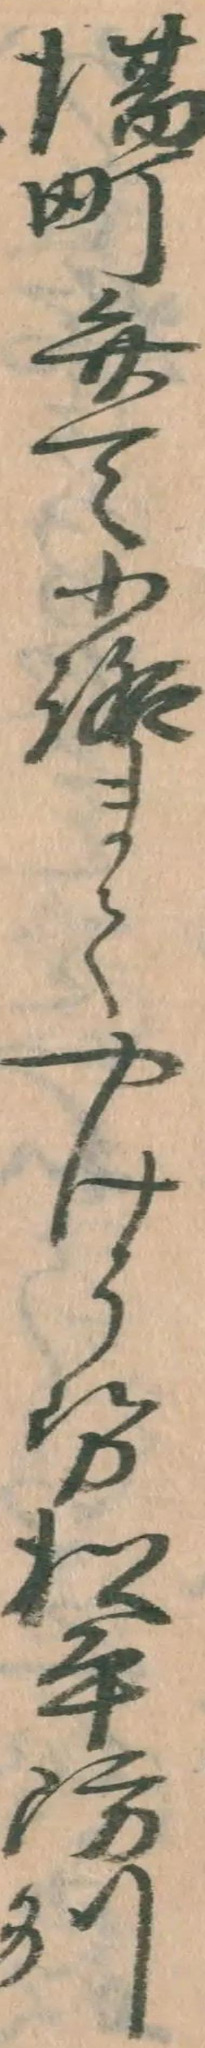場町弁天小路まてやけうせ松平防州
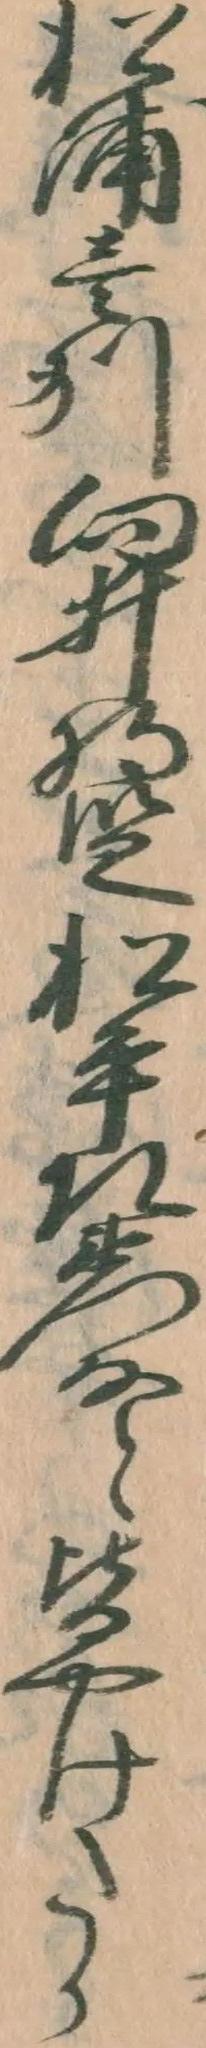松浦壱州向井将監松平左衛門なと皆やけたり
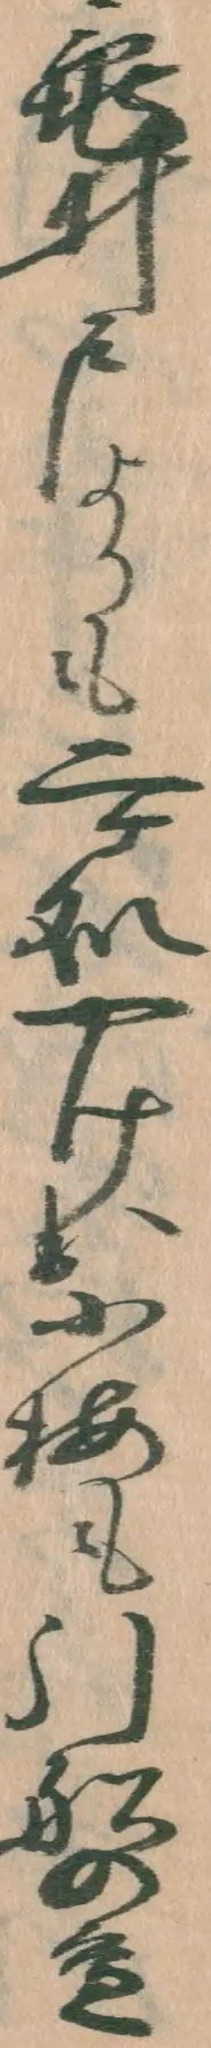亀井戸よりも二ヶ処やけ出小梅も引船の邊
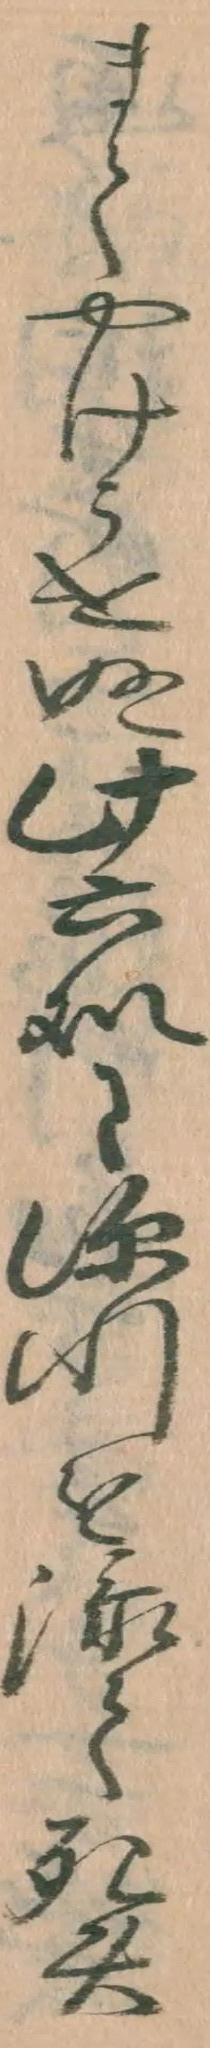まてやけうせぬ此六処に深川を添て死失
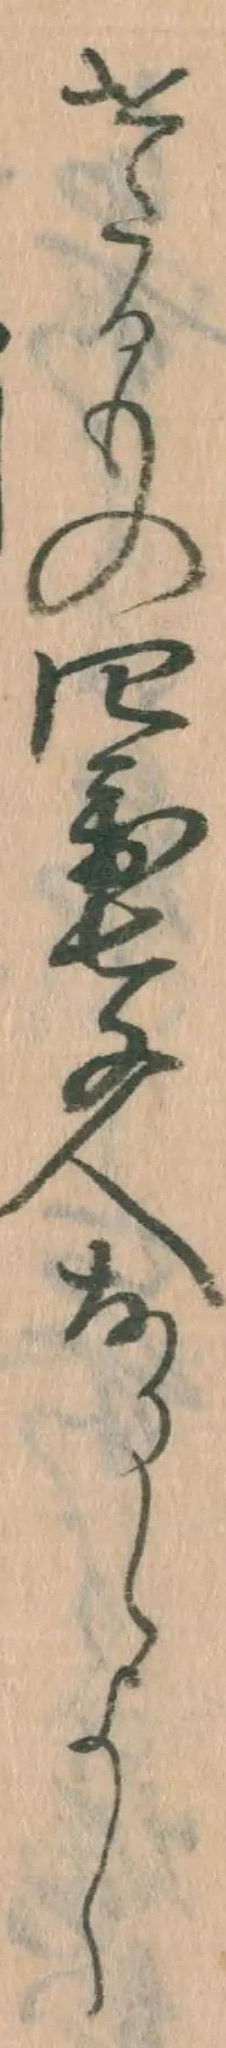せたるもの四萬七千人なりしよし
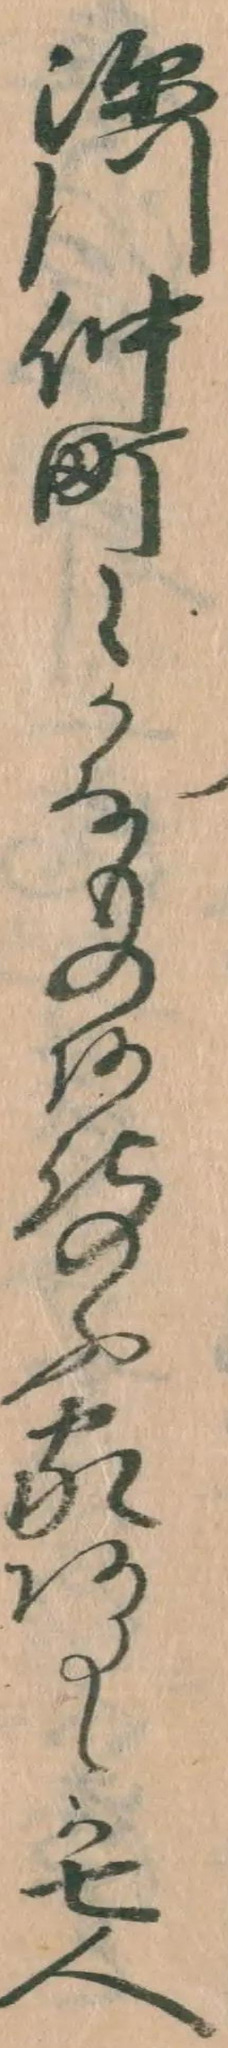深川仲町にかなものあきのふ家ありしか七人
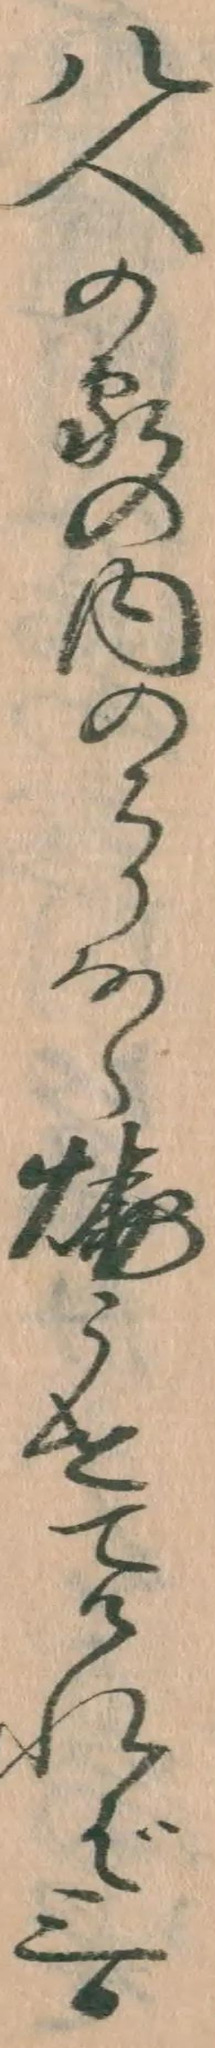八人の家の内のこりなく燒うせてければ三日
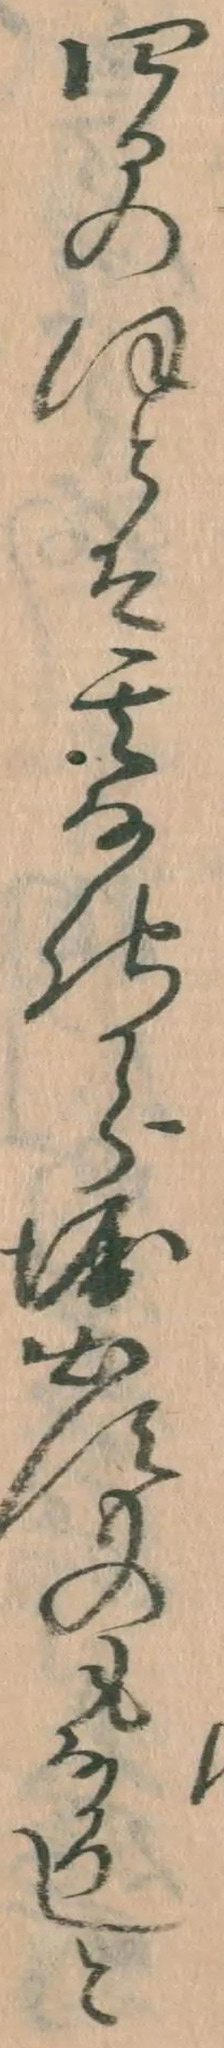四日のほとは其なきから堀出すものもなかりしと
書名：麗斎叢書. 20
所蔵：国立国会図書館 National Diet Library, JAPAN
